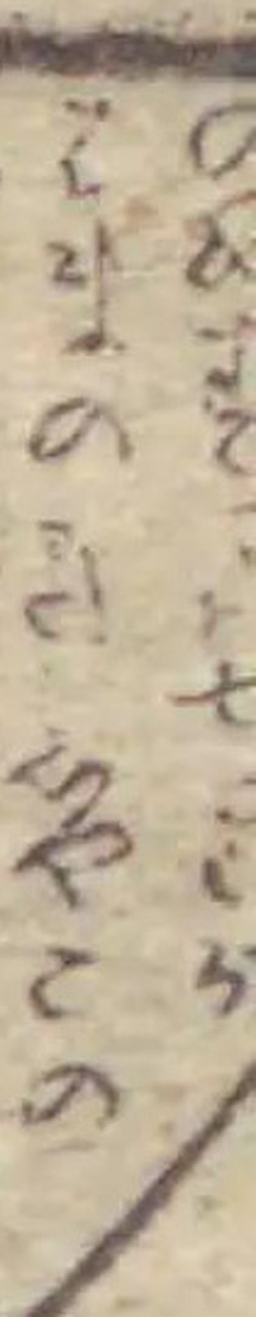はまのきしやこの
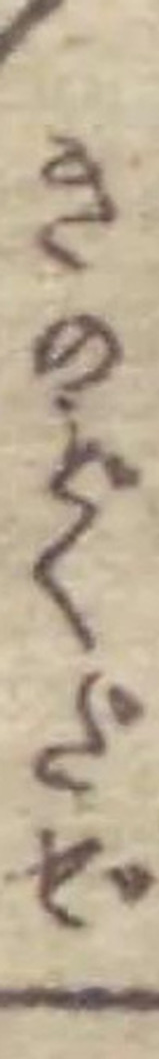きのどくだぜ
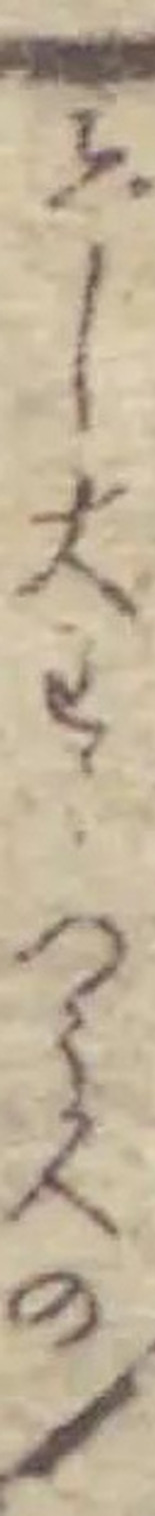ごとし大わうつう人の
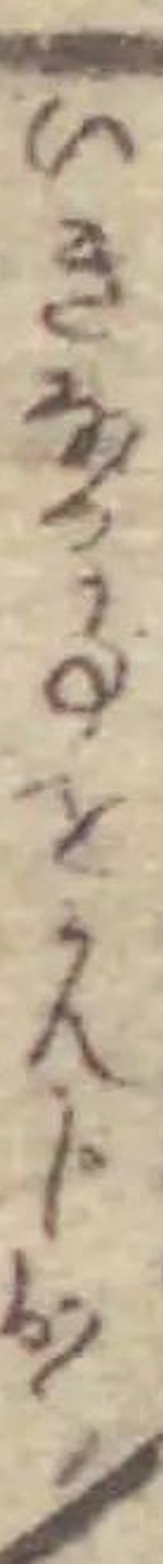いきなる事をかんじおゝ
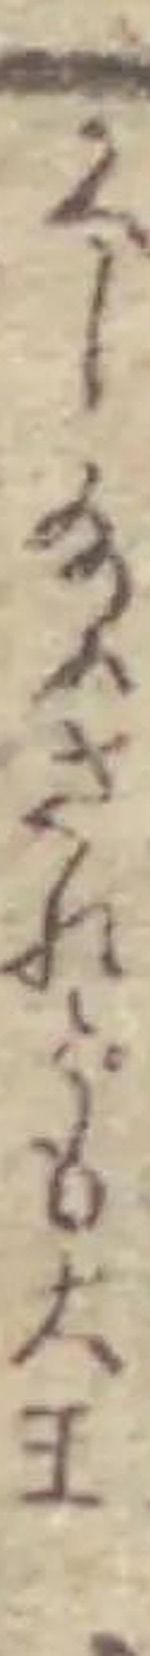かへし給ふされども大王
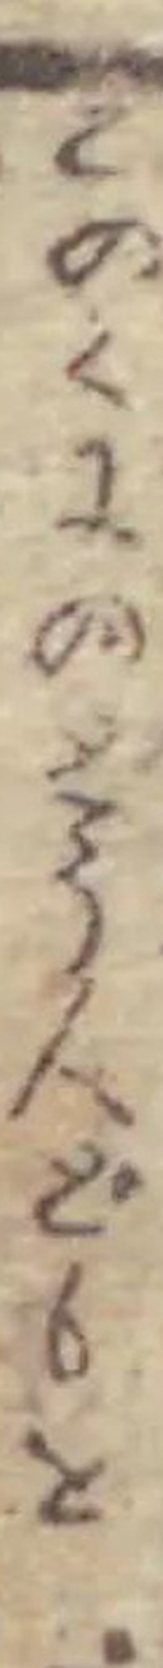このくにのとう人どもを
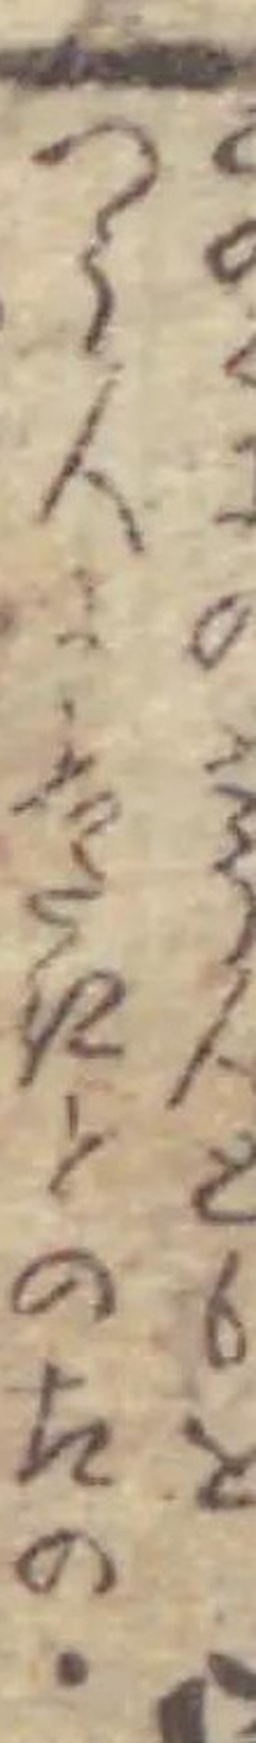つう人にしたきとのたの
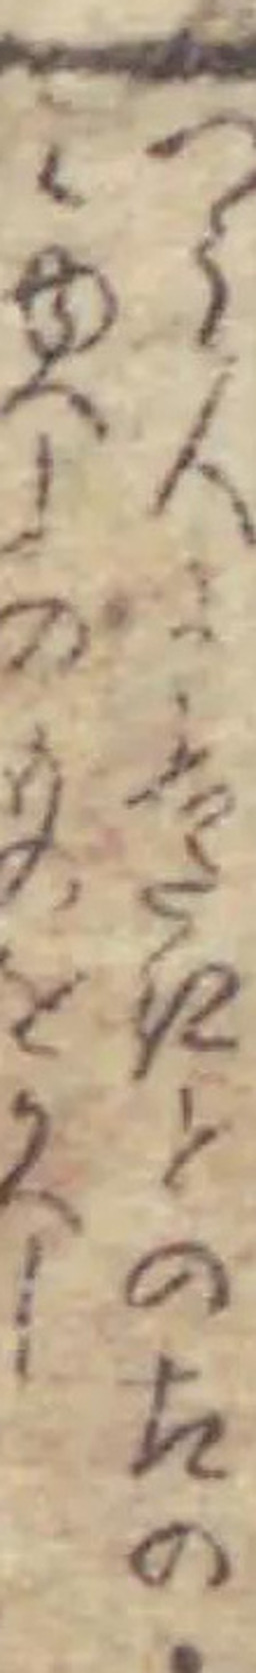みゆへよのものをかへし
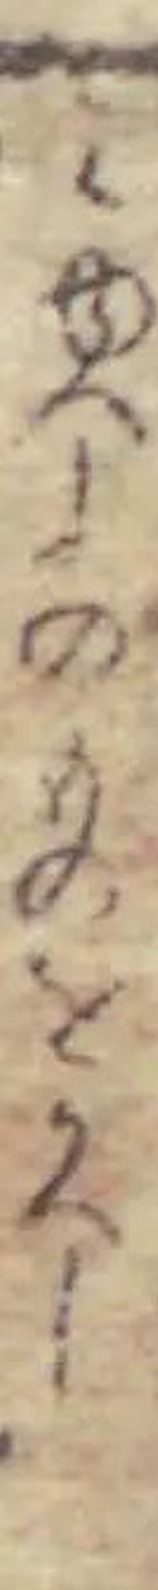みゆへよのものをかへし
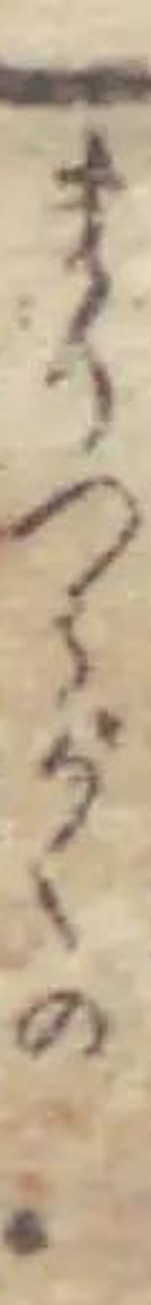まりつうがくの
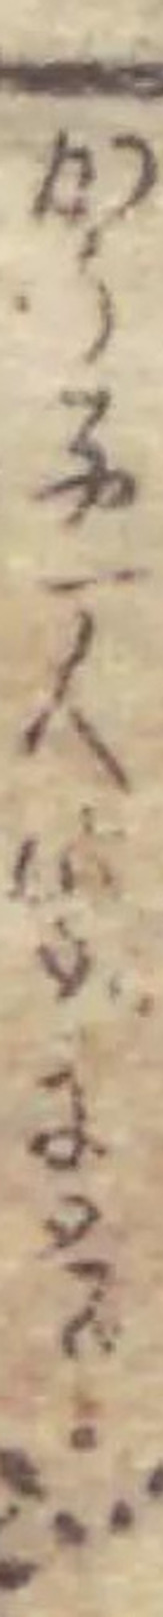かう子一人にとゞ
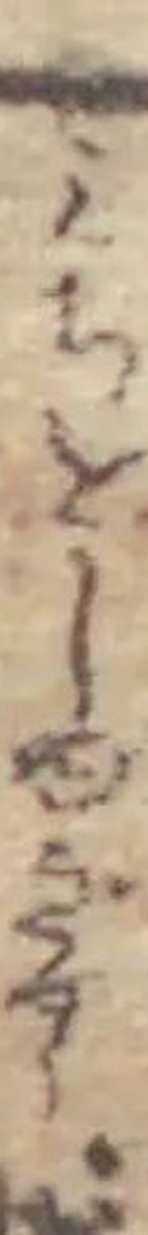みちをしゆぎやう
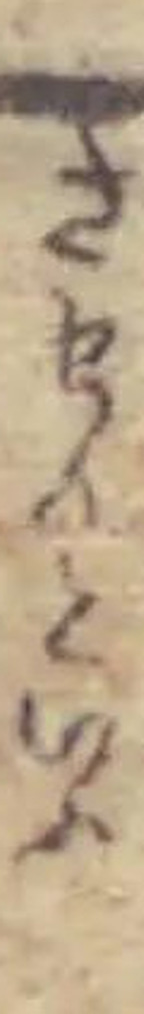させんといふ
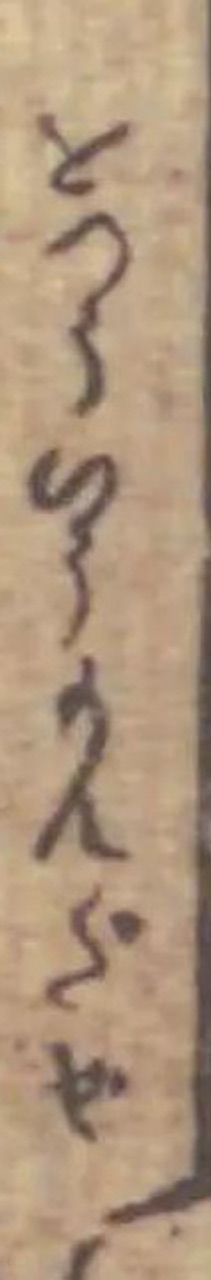をつういうもんだぜ
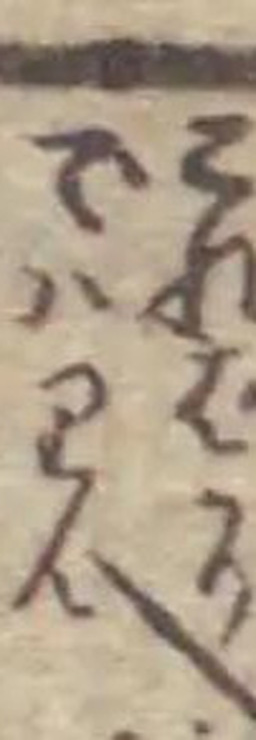ではりん
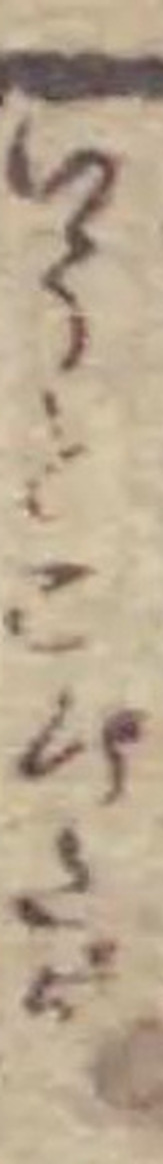いうところたが
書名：茶羅毛通人 3巻
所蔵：国立国会図書館 National Diet Library, JAPAN
